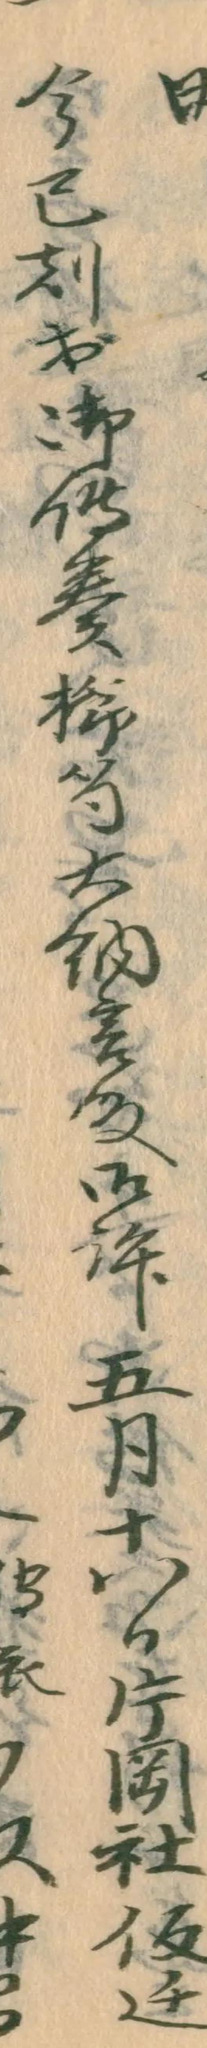一今巳刻於御伝奏櫛笥大納言殿御評五月十八日片岡社仮迁
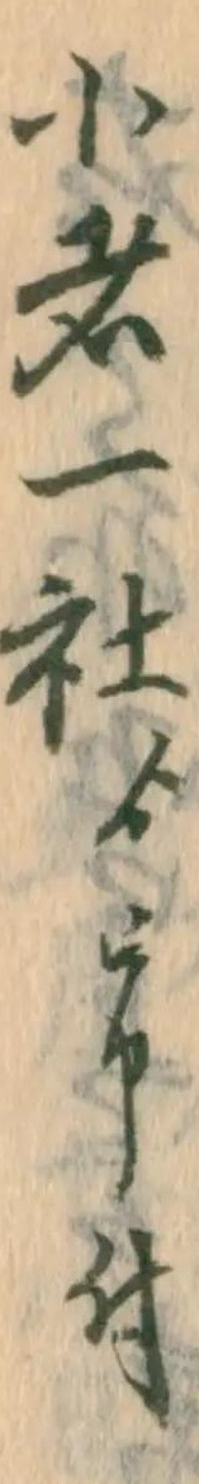小者一社ゟ被申付
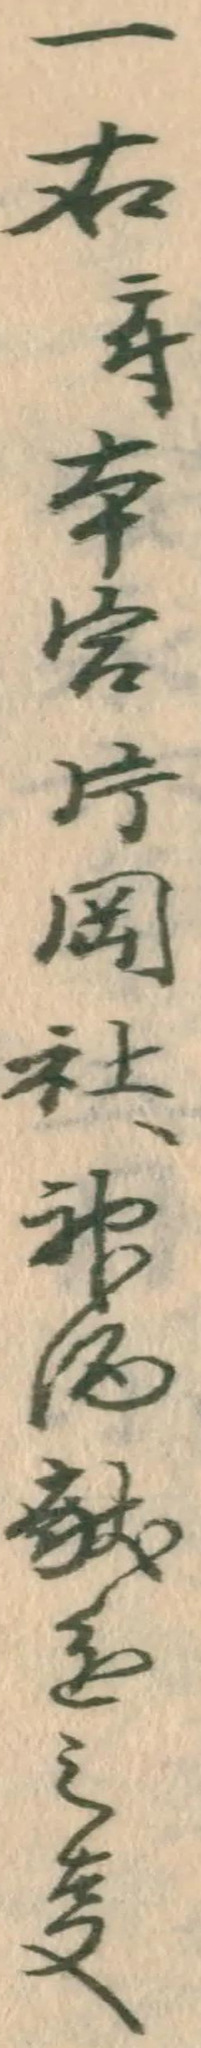一右ニ付本宮片岡社へ神酒献進之事
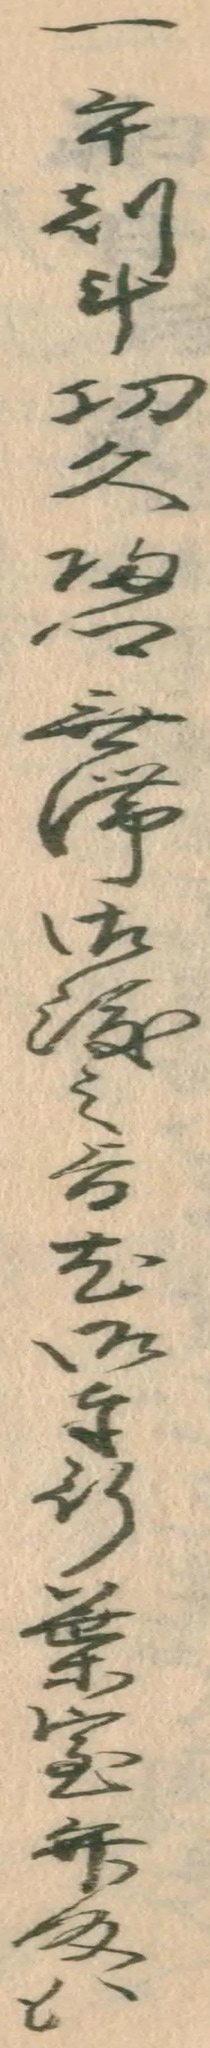一午刻計功久帰郷無滞御渡之旨尤御奉行葉室弁殿へも
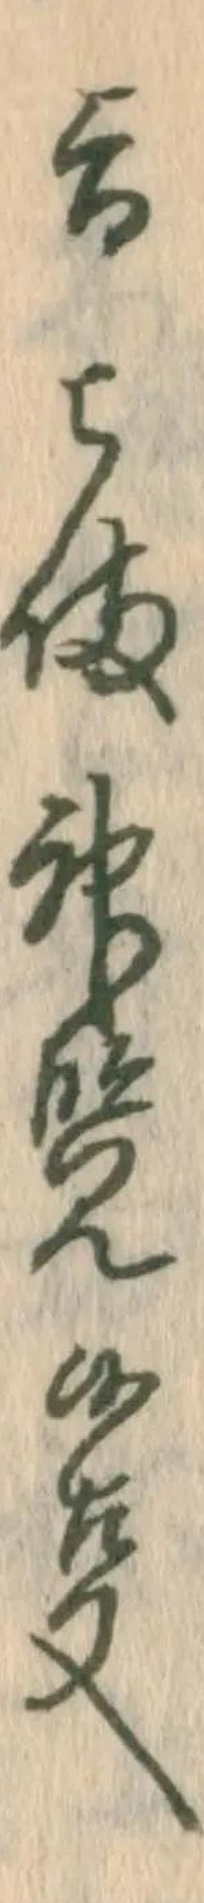旨被備神覧候事

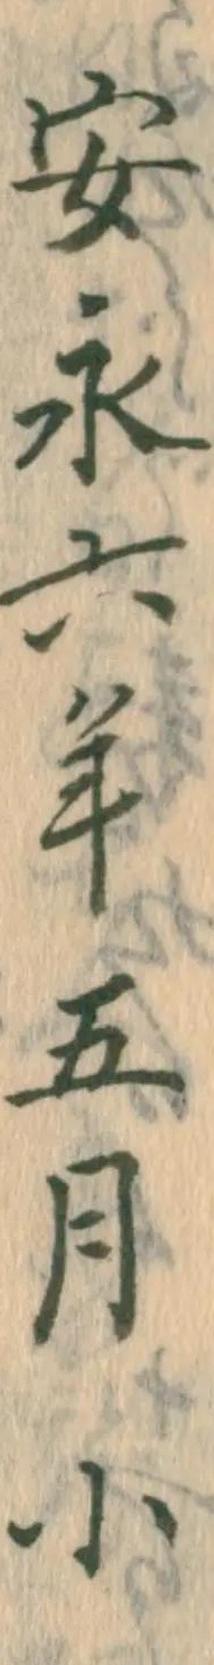安永六年五月小
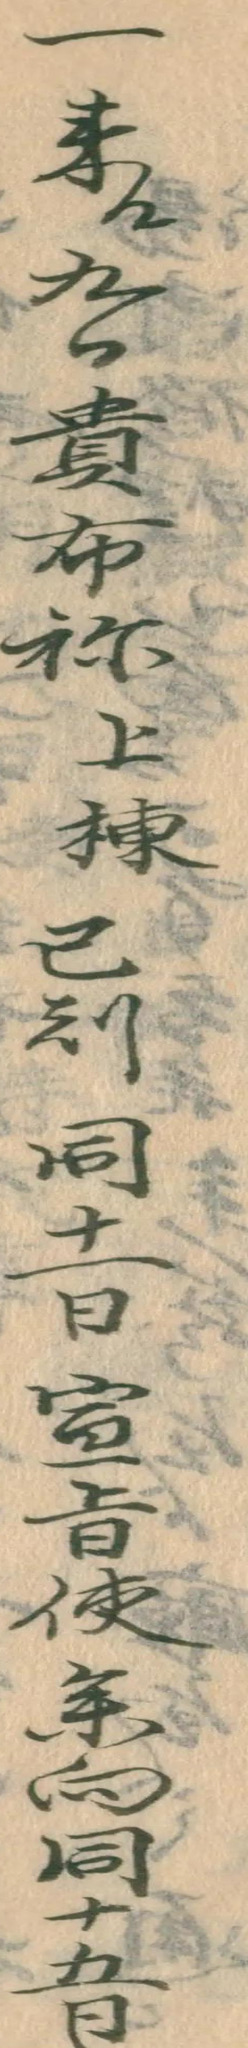一来ル九日貴布祢上棟巳刻同十一日宣旨使参向同十五日
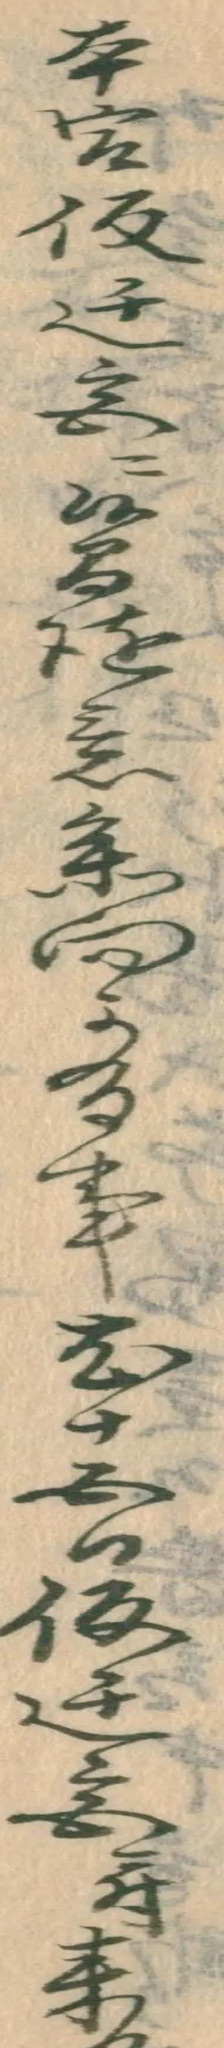本宮仮迁宮ニ候間随意参向可有事尤十五日仮迁宮ニ付来ル
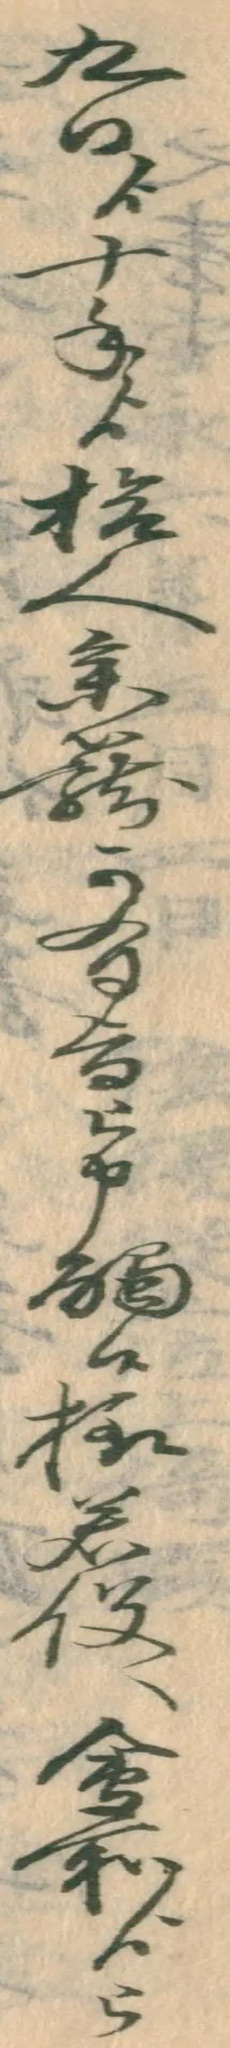九日ゟ十手ゟ拾人参籠可有旨被申触候様若役へ会所ゟ被
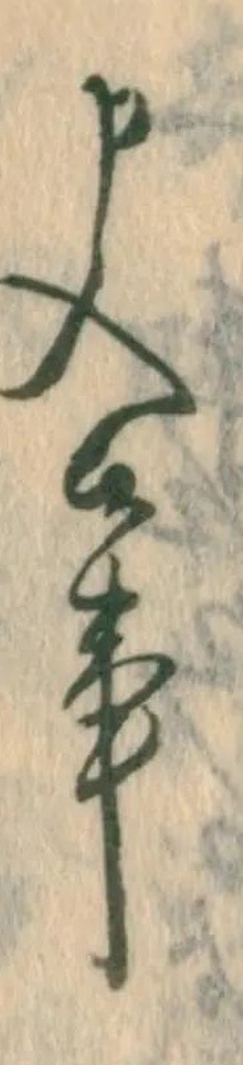申入候事
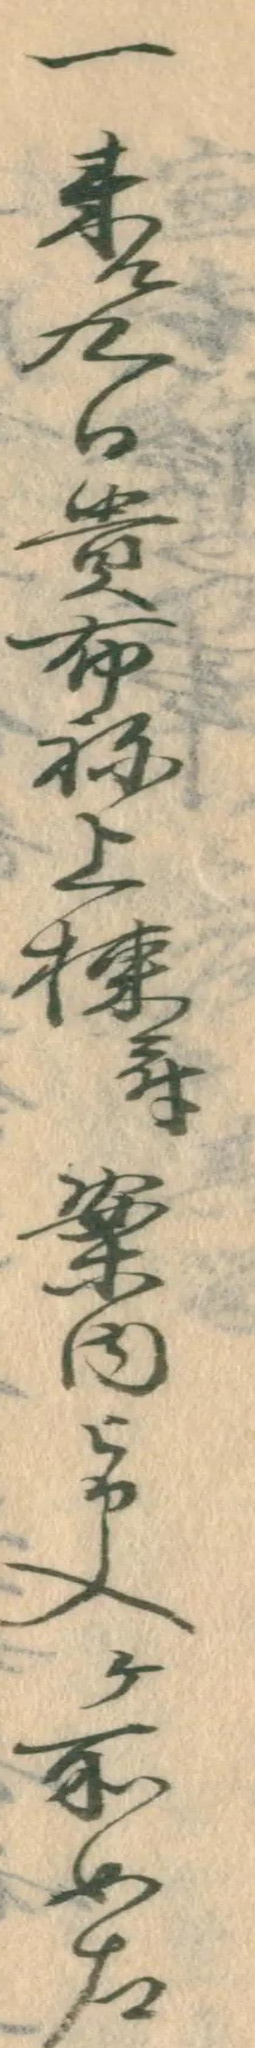一来ル九日貴布祢上棟ニ付案内被申入ケ所如左
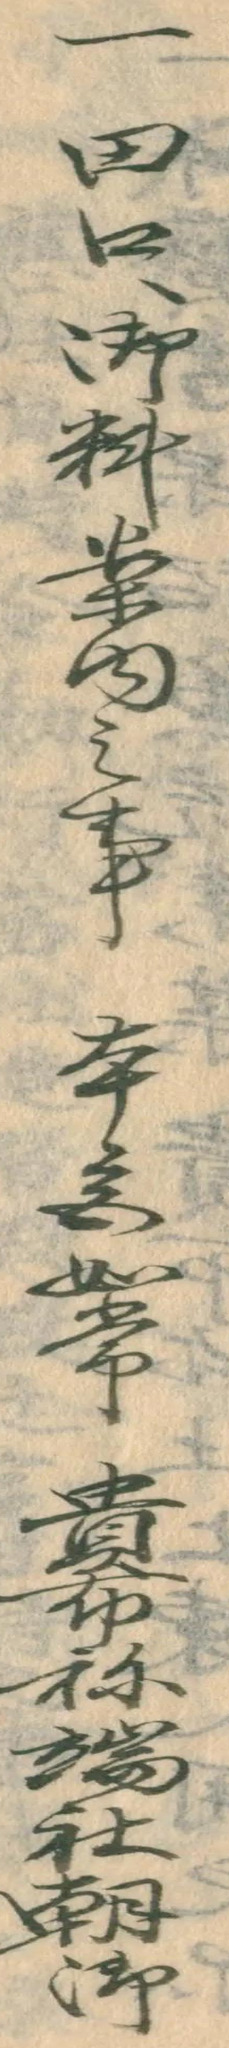一田口へ御料案内之事本宮如常貴布祢端社朝御
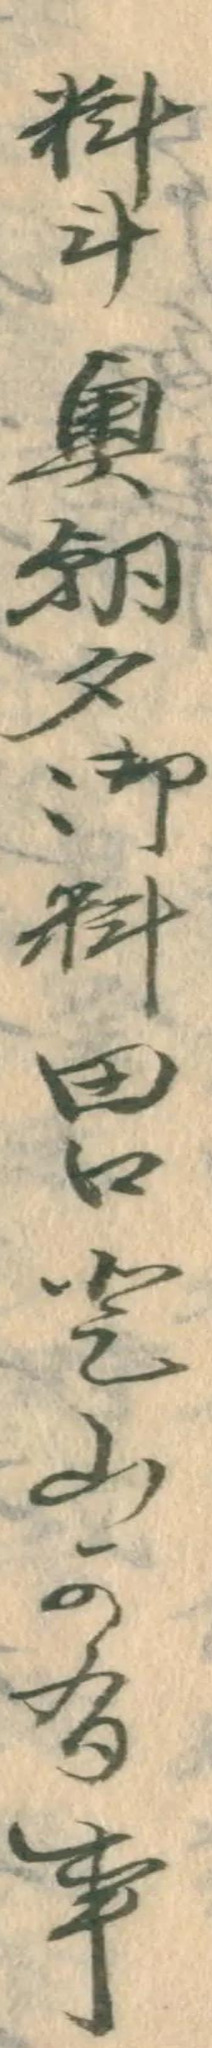料計奥朝夕御料田口登山可有事
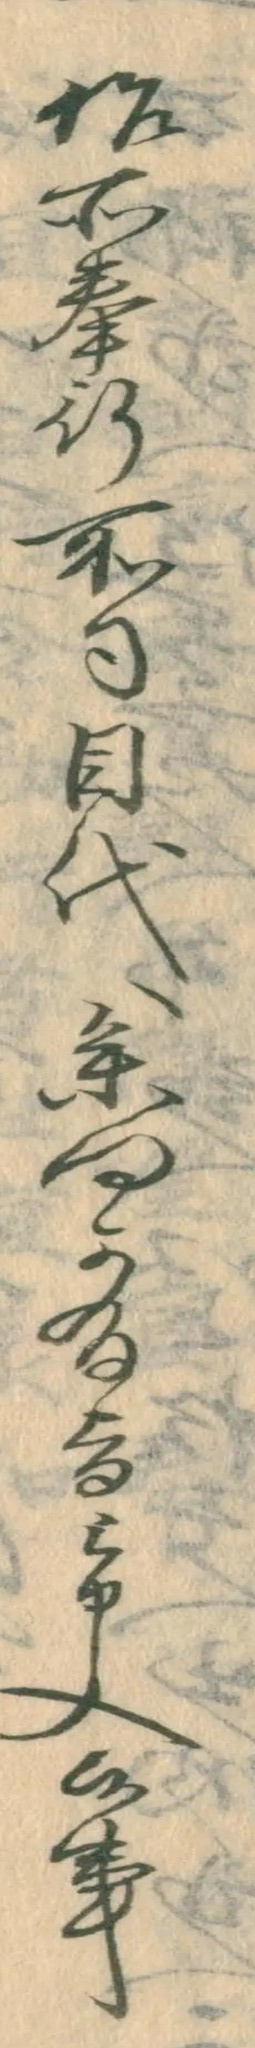一作所奉行所司目代へ参向可有旨被申入候事
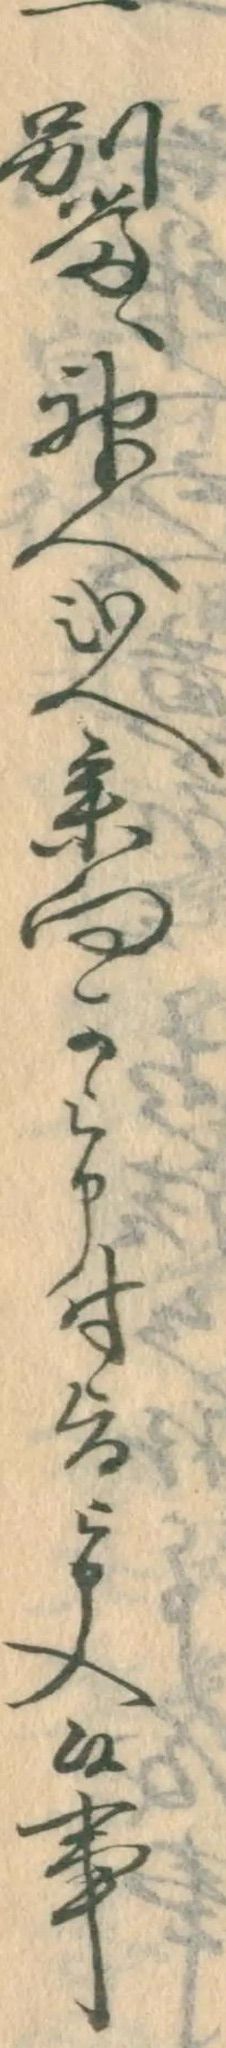一別当へ神人弐人参向可被申付旨被申入候事

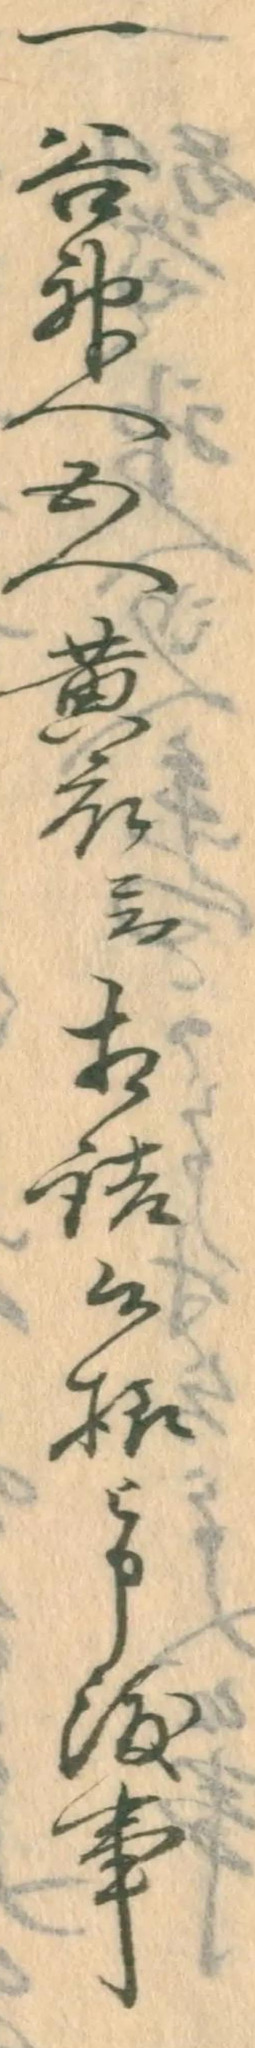一谷神人五人黄衣ニ而相詰候様被申渡事
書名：賀茂社記録. 第17冊
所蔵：国立国会図書館 National Diet Library, JAPAN
